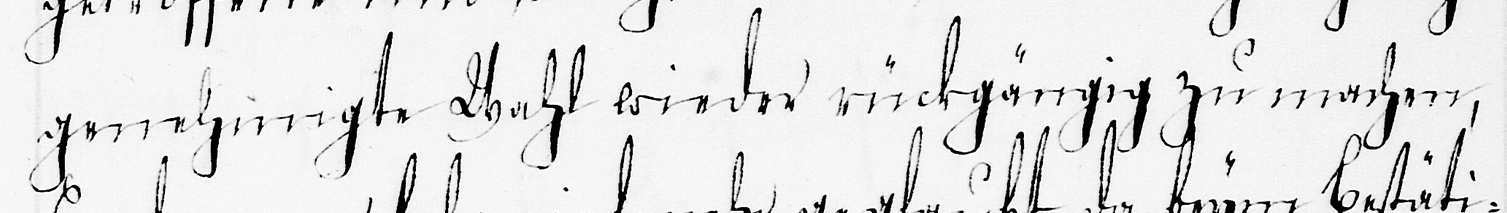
genehmigte Wahl wieder rückgängig zu machen,
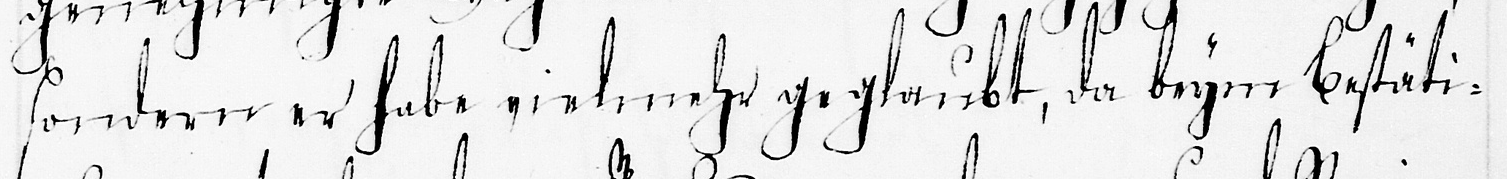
sondern er habe vielmehr geglaubt, da beym Bestäti¬
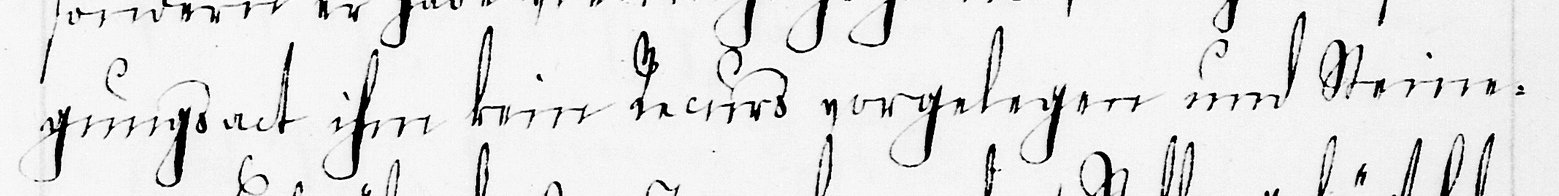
gungsact ihm kein Recurs vorgelegen und Steine¬
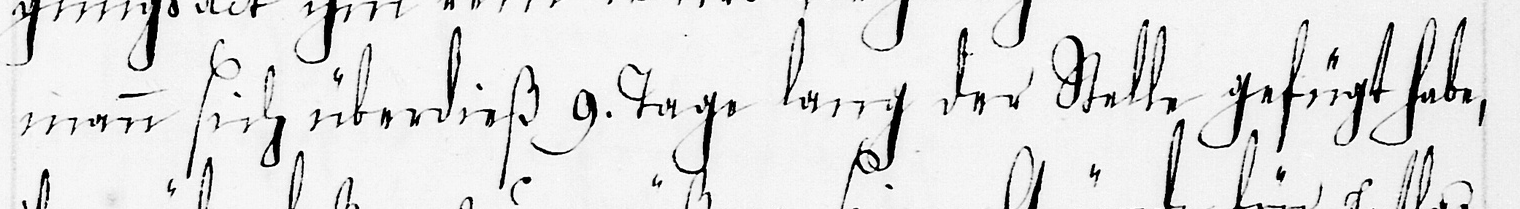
mann sich überdieß 9. Tage lang der Stelle gefügt habe,
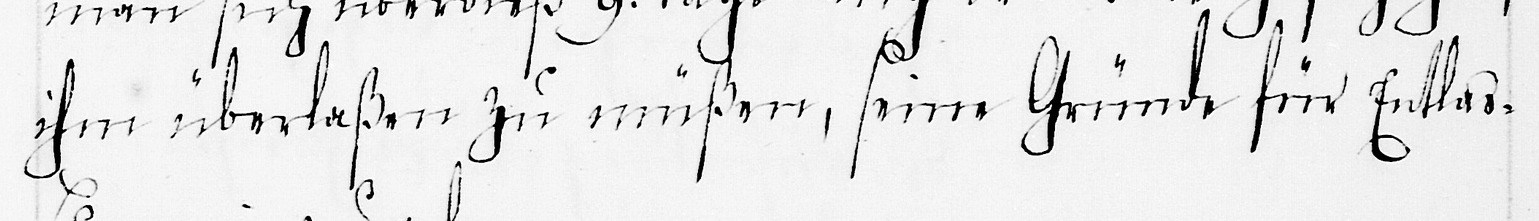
ihm überlaßen zu müßen, seine Gründe für Entla¬
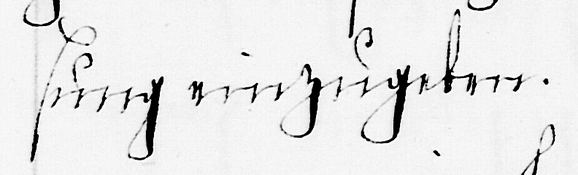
ßung einzugeben:
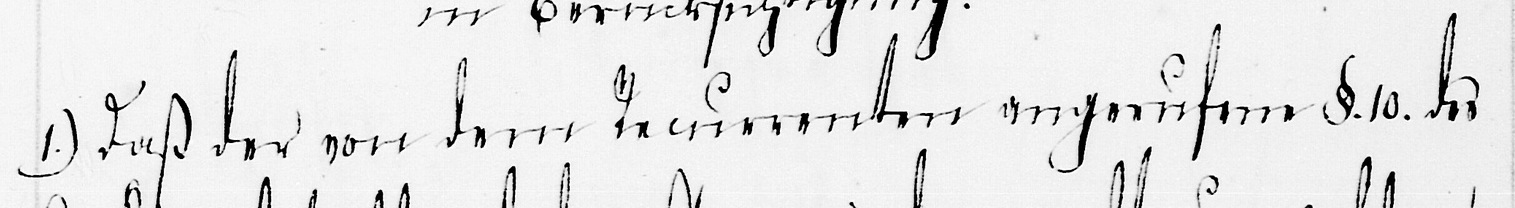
1.) Daß der von dem Recurrenten angerufene §. 10. des
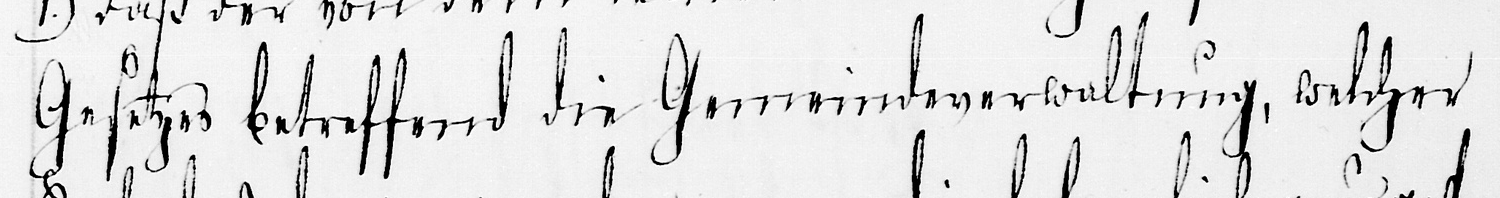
Gesetzes betreffend die Gemeindeverwaltung, welcher
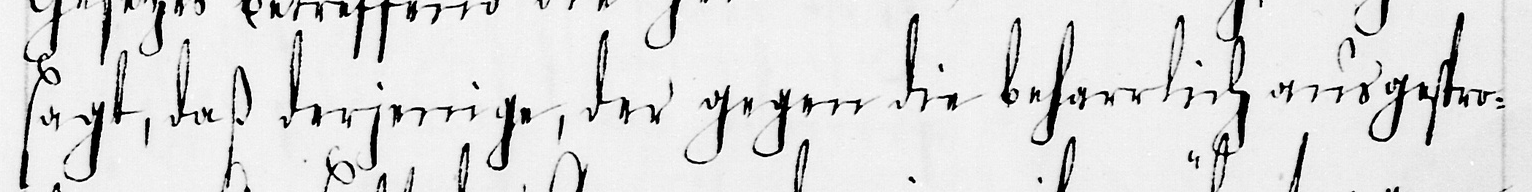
sagt, daß derjenige, der gegen die beharrlich ausgespro¬
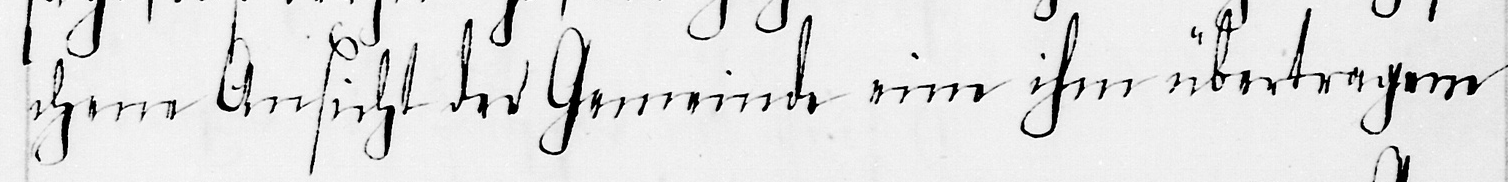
chene Ansicht der Gemeinde eine ihm übertragene
